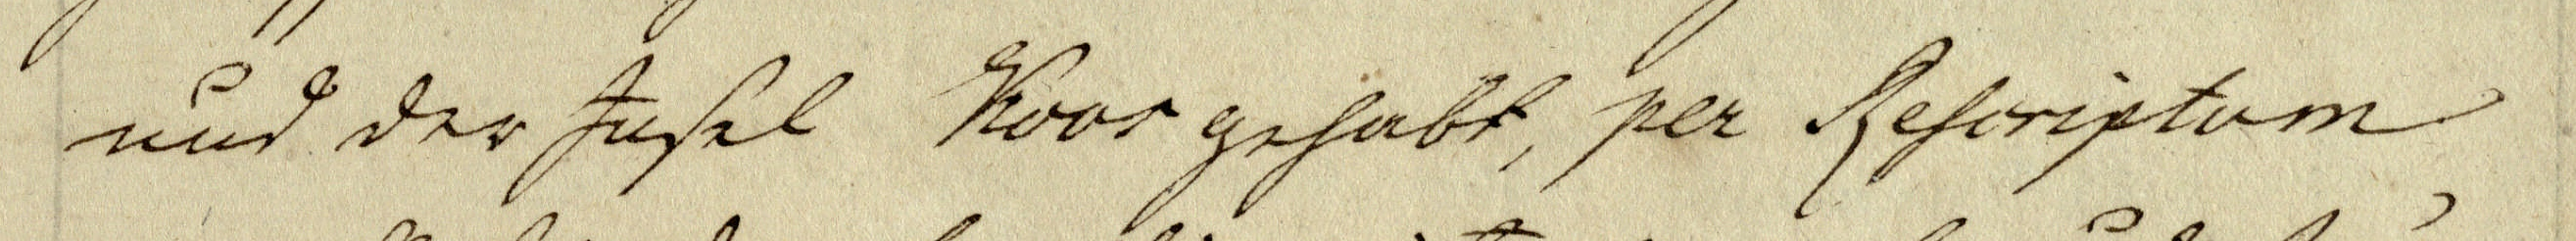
und der Insel Koos gehabt, per Rescriptum
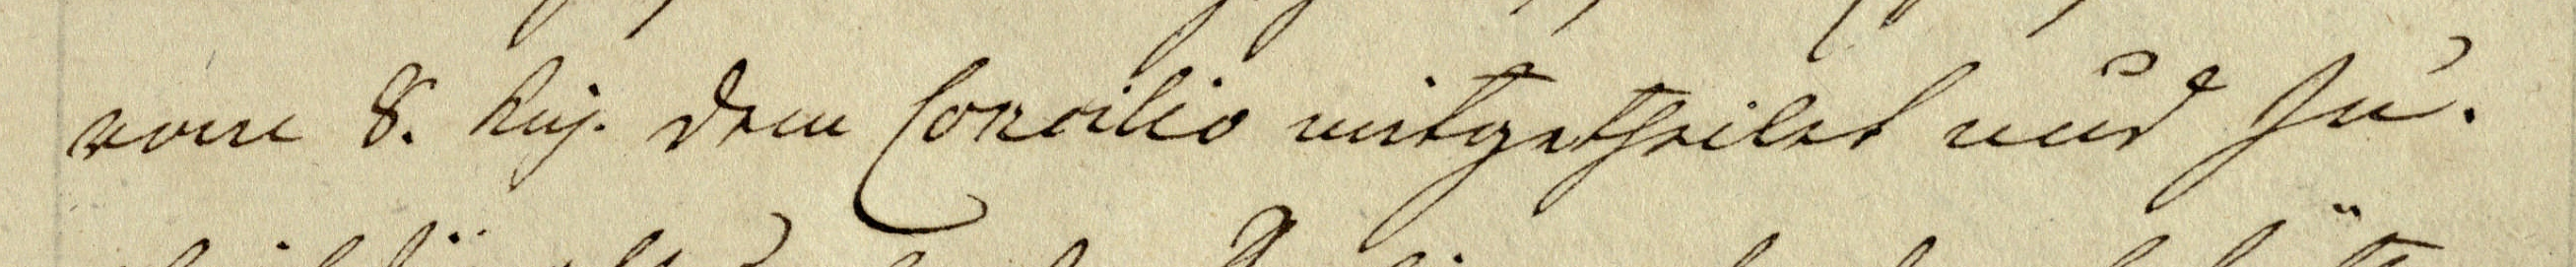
vom 8. huj. dem Concilio mitgetheilet und zu¬
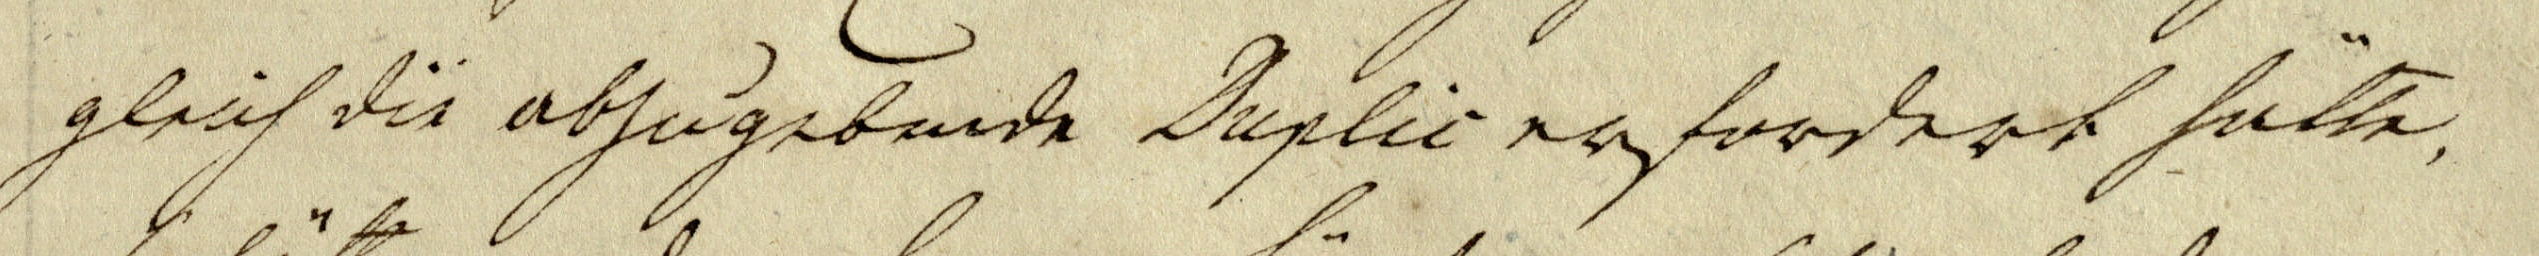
gleich die abzugebenden Duplic erfordert hätte,
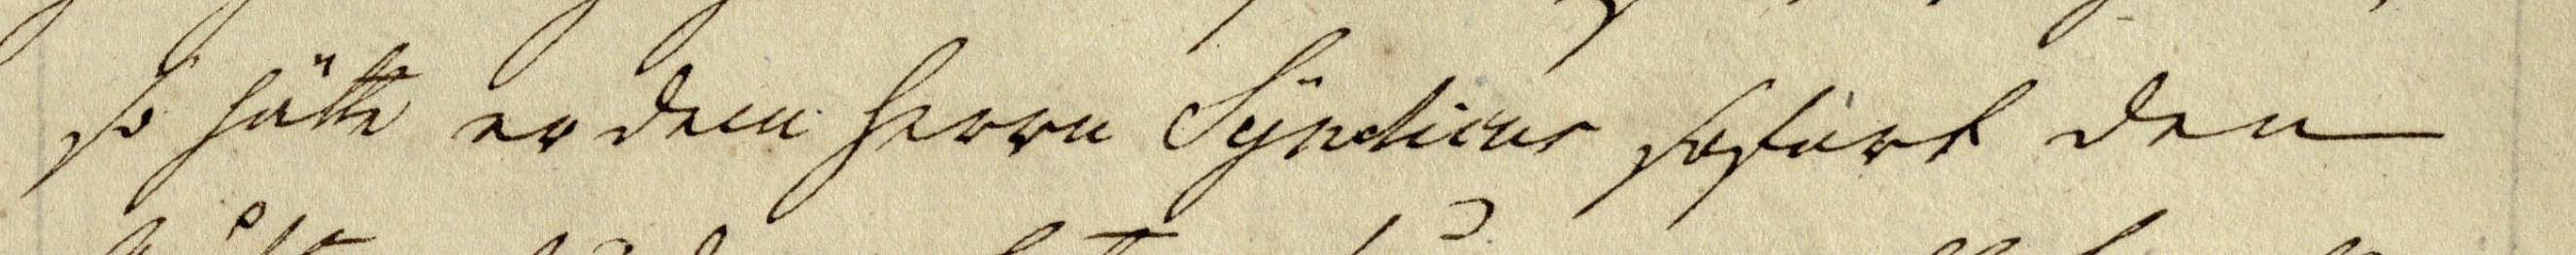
so hätte er dem Herrn Sÿndicus sofort den
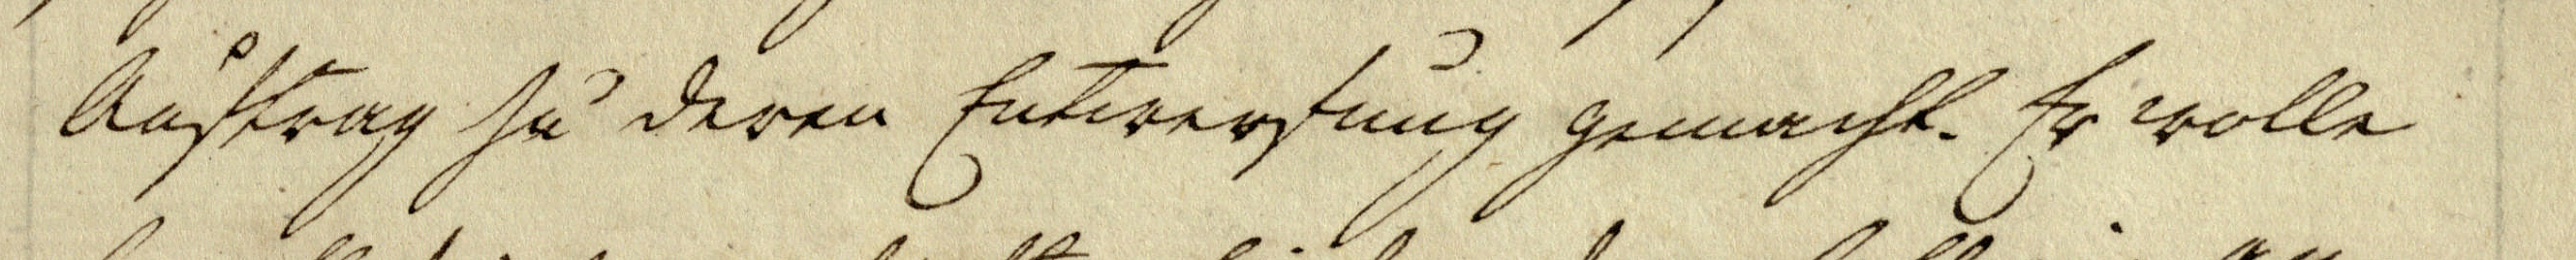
Auftrag zu deren Entwerfung gemacht. Er wolle
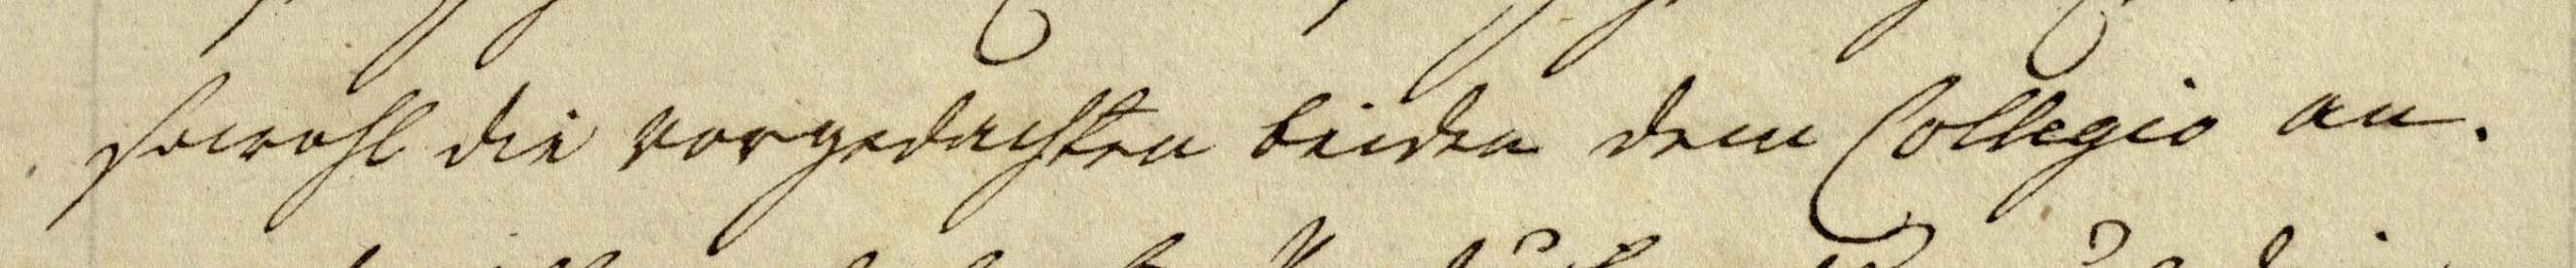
sowohl die vorgedachten beiden dem Collegio an¬
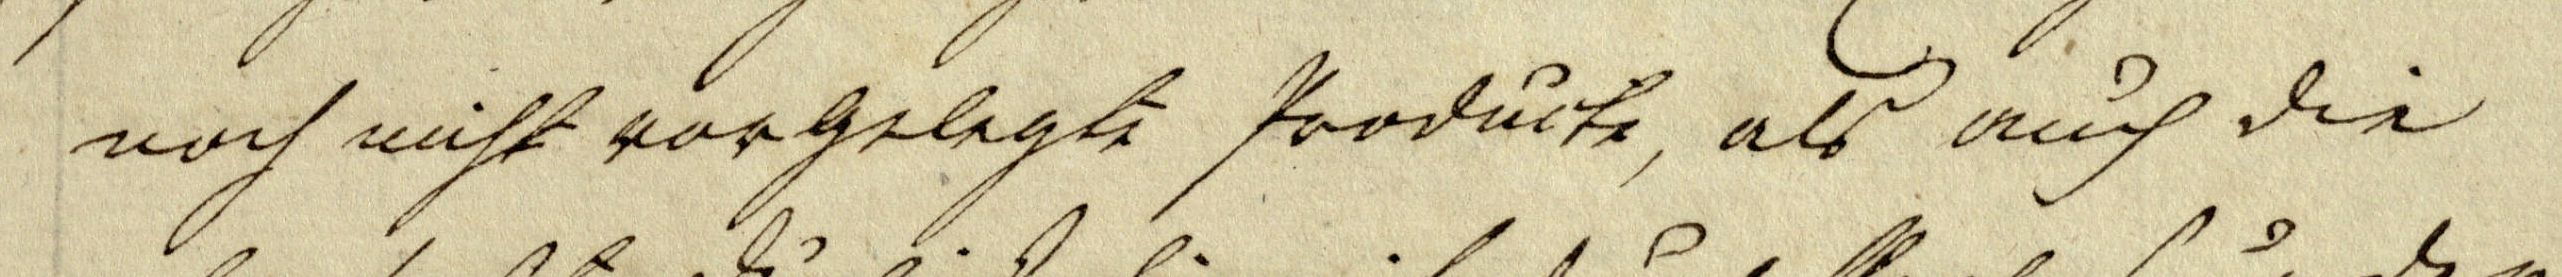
noch nicht vorgelegte Producte, als auch die
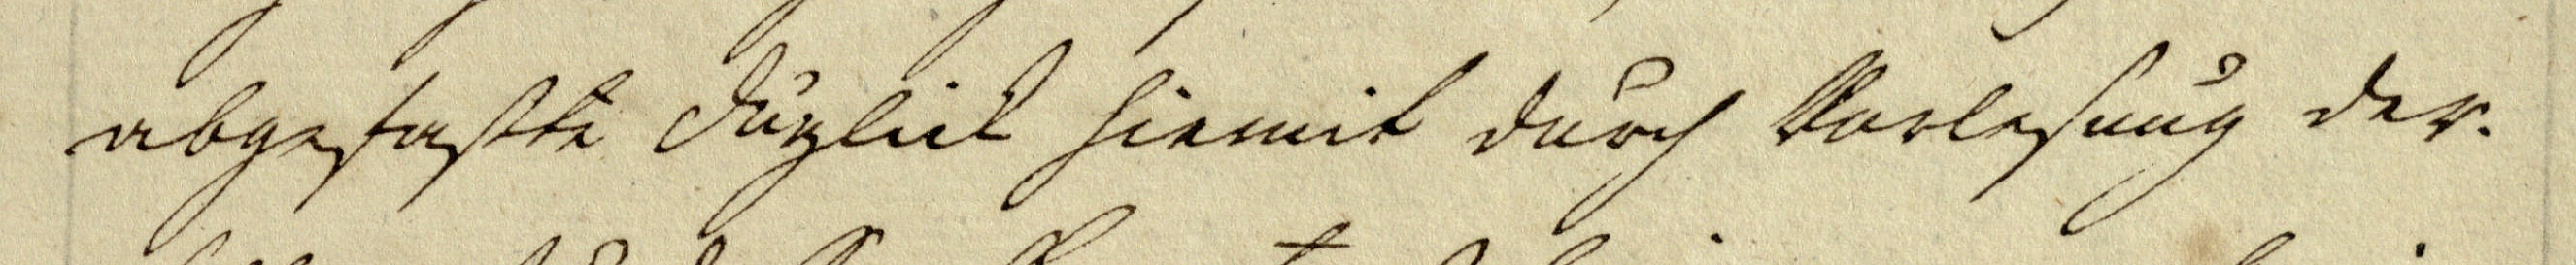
abgefaßte Duplick hiemit durch Vorlesung der¬
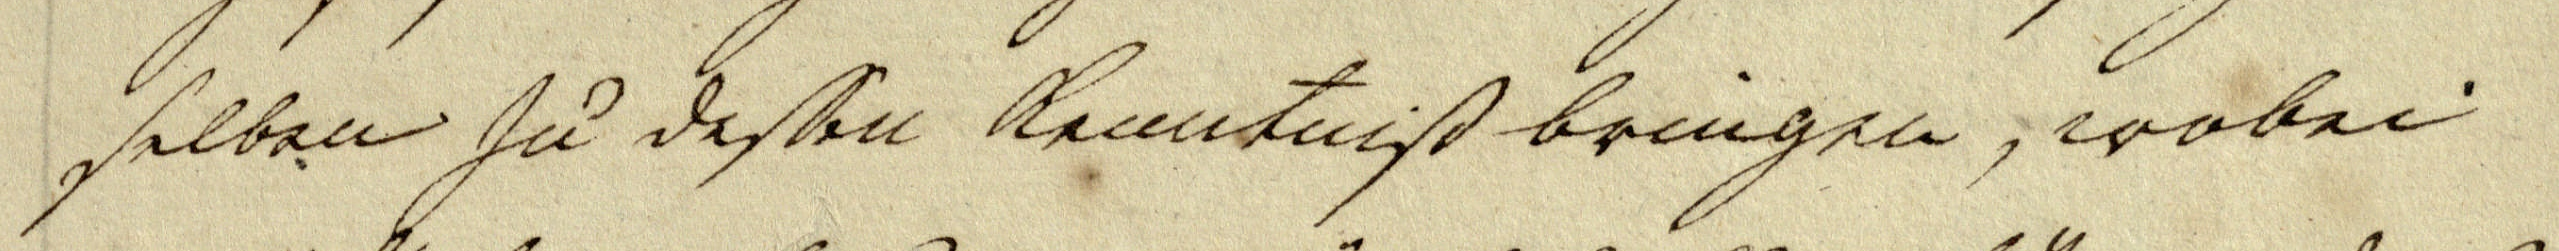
selben zu dessen Kenntniß bringen, wobei
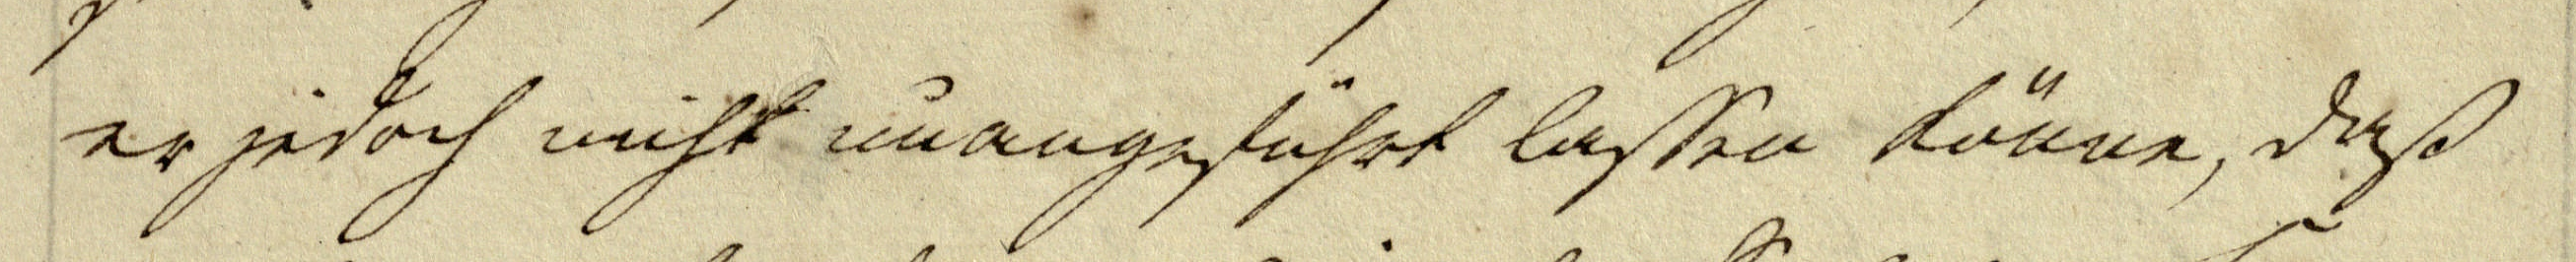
er jedoch nicht unangeführt lassen könne, daß
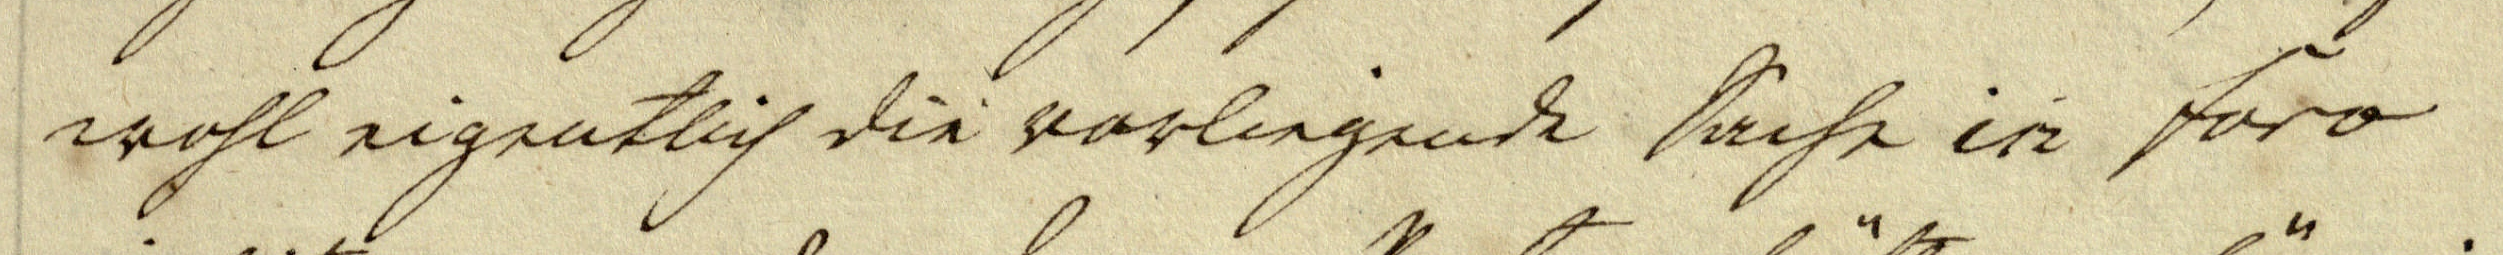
wohl eigentlich die vorliegende Sache in foro
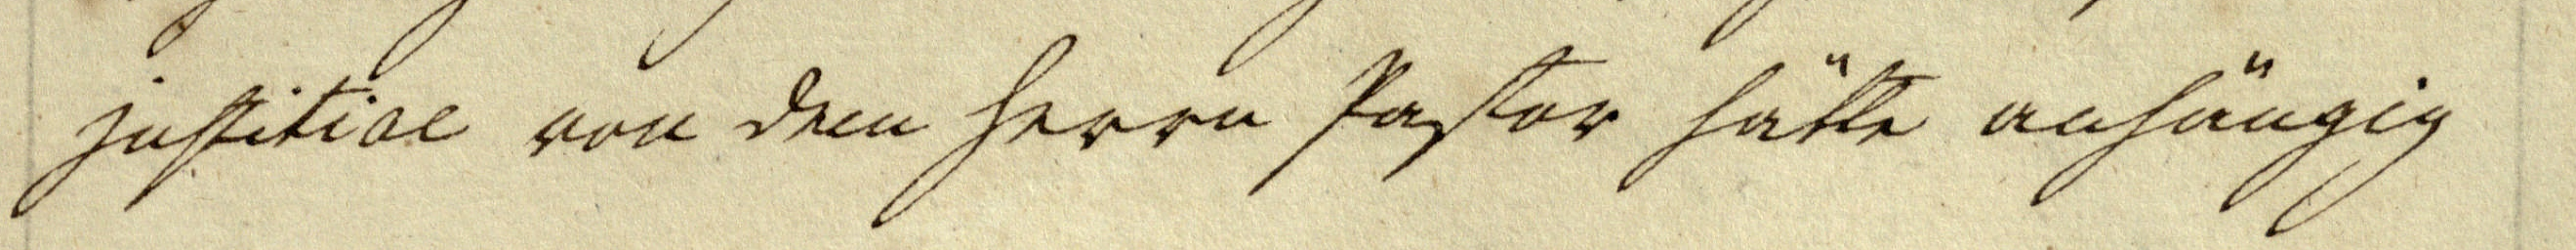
justitiae von dem Herrn Pastor hätte anhängig
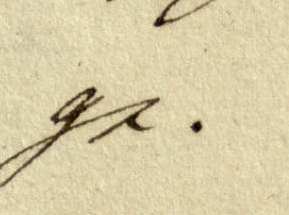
ge¬
